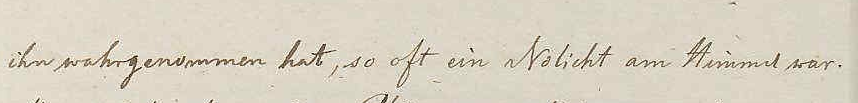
ihn wahrgenommen hat, so oft ein Ndlicht am Himmel war.
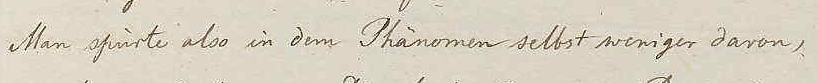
Man spürte also in dem Phänomen selbst weniger davon,
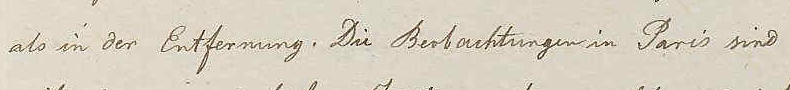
als in der Entfernung. Die Beobachtungen in Paris sind
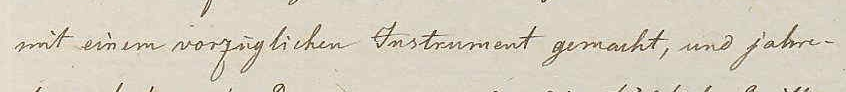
mit einem vorzüglichen Instrument gemacht, und jahre-
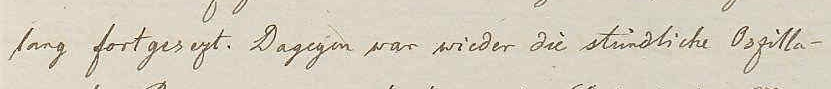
lang fortgesezt. Dagegen war wieder die stündliche Oszilla-
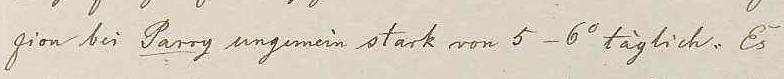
zion bei Parry ungemein stark von 5–6° täglich: Es
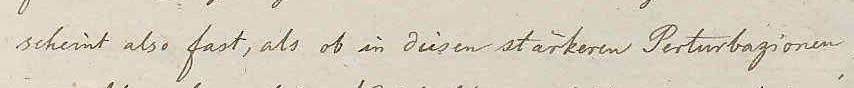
scheint also fast, als ob in diesen stärkeren Perturbazionen
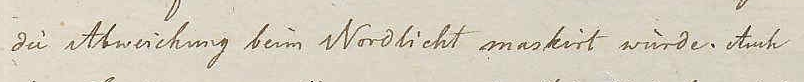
die Abweichung beim Nordlicht maskirt würde. Auch
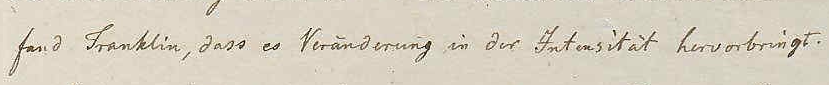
fand Franklin, dass es Veränderungen in der Intensität hervorbringt.
